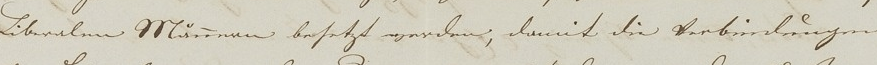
Liberalen Männern besetzt werden, damit die Verbindungen
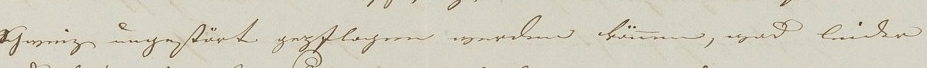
Schweiz ungestört gepflogen werden können, was leider
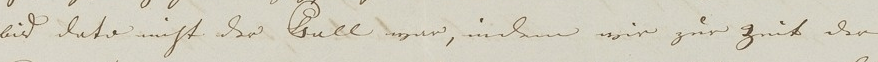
bis dato nicht der Fall war, indem wir zur Zeit der
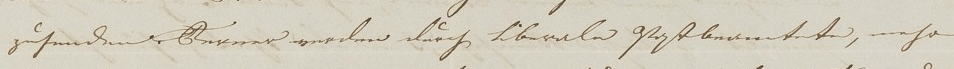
zusenden. Ferner werden durch liberale Postbeamtete, mehr
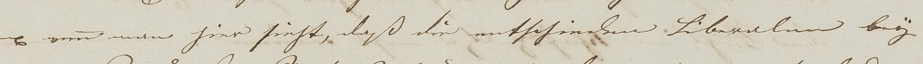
& wenn man hier sieht, daß die entschieden Liberalen bey
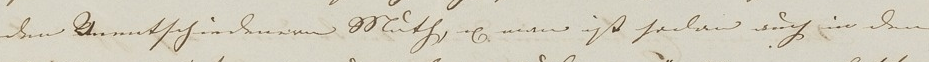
den Unentschiedenern Muth, & man ist sodan auch in den
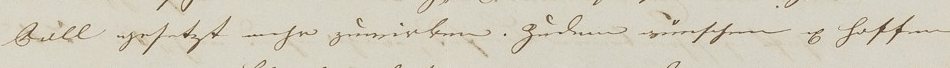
Fall gesetzt mehr zuwirken. Zudem wünschen & hoffen
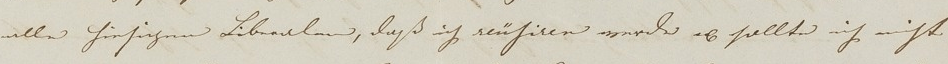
alle hiesigen Liberalen, daß ich reüsiren werde & sollte ich nicht
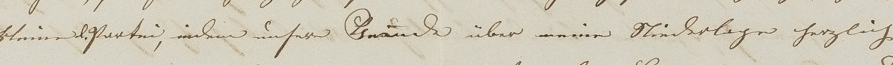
kleine l. Partei, indem unsere Feinde über meine Niederlage herzlich
